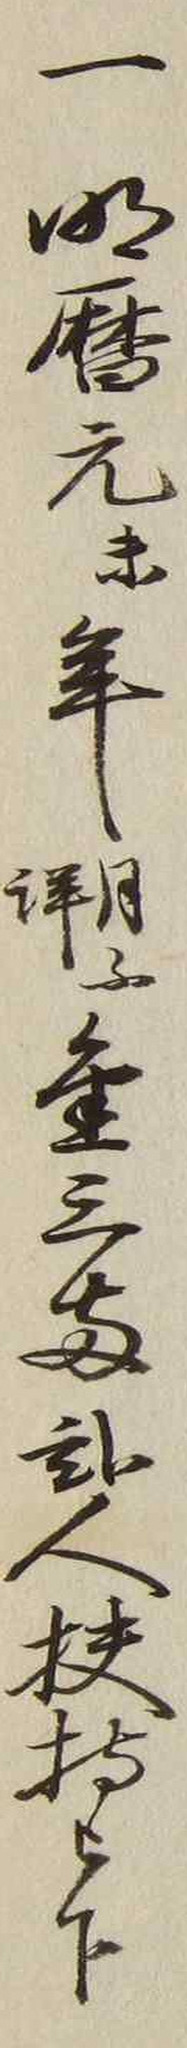一明暦元未年月不詳金三両弐人扶持被下

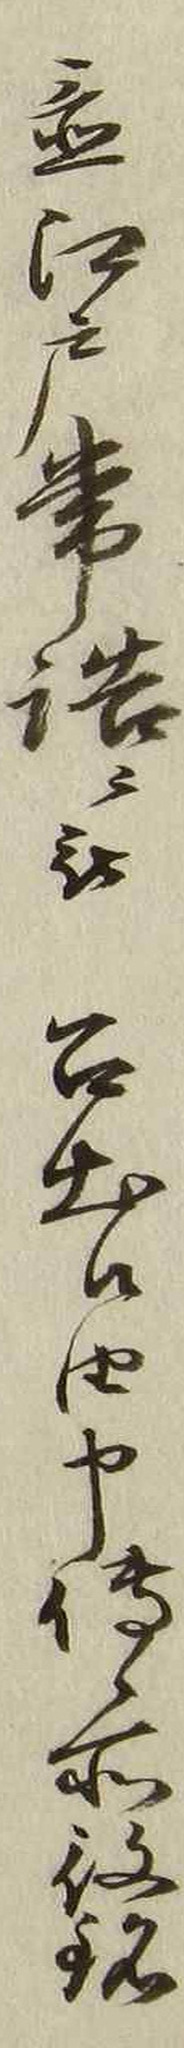置江戸常詰ニ被召出候由申伝候所役銘
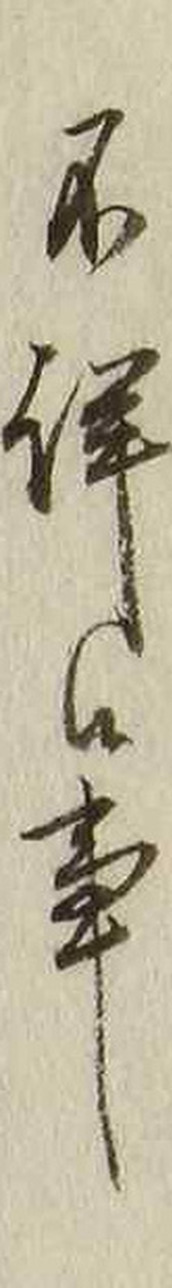不詳候事
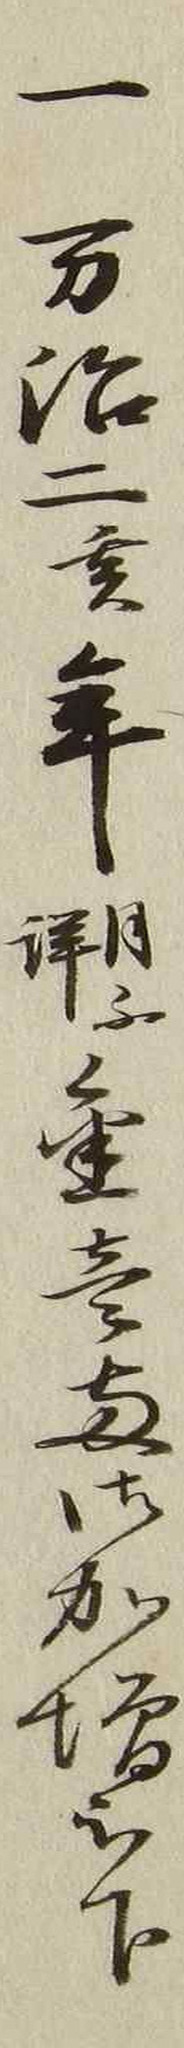一万治二亥年月不詳金壱両御加増被下
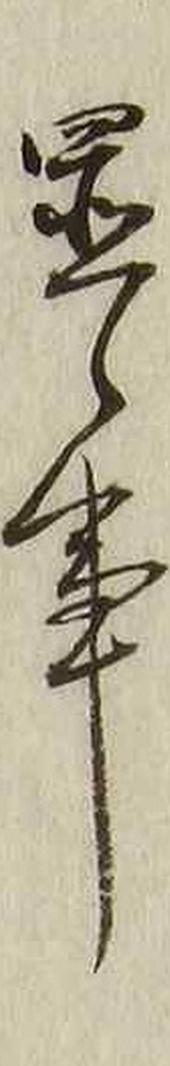置候事
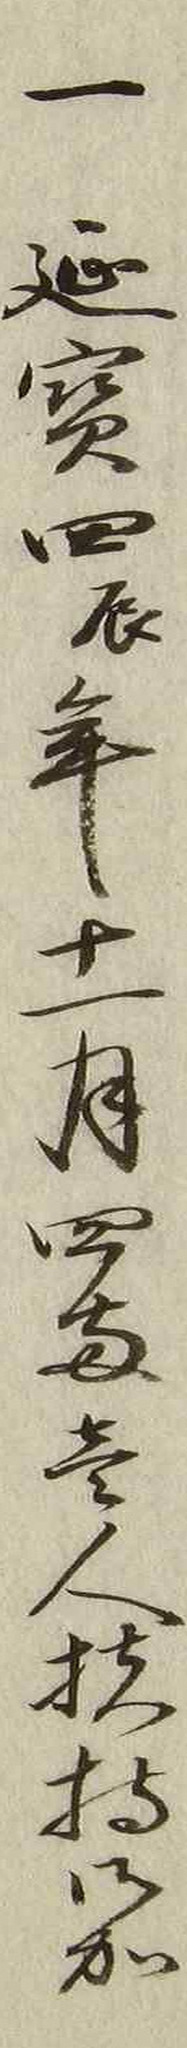一延宝四辰年十一月四両壱人扶持御加
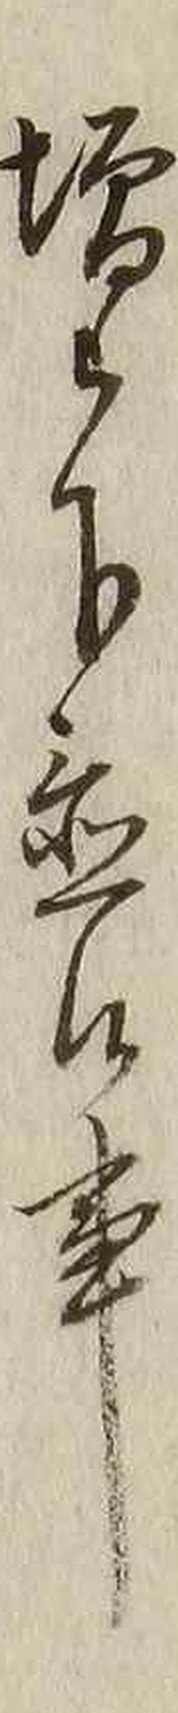増被下置候事
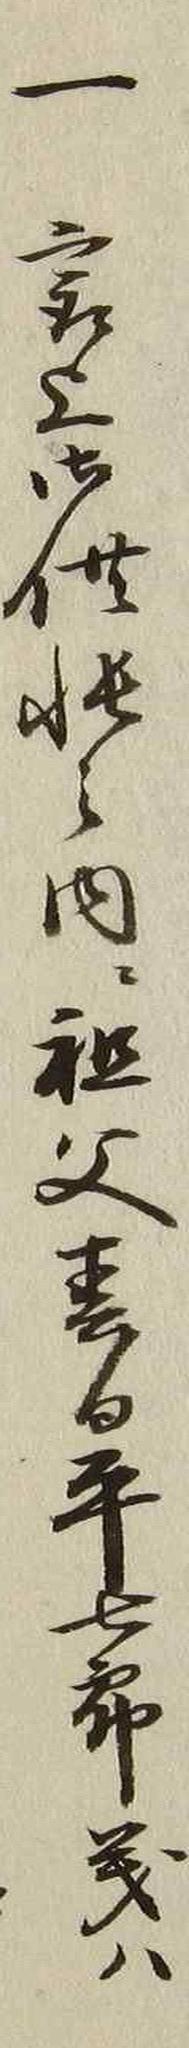一最上御供帳之内ニ祖父春日平七郎義ハ
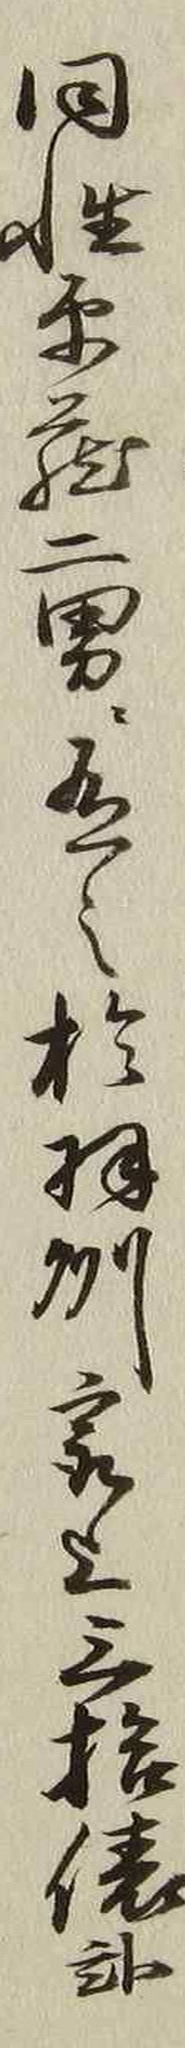同性平蔵二男ニ有之於羽州最上三拾俵弐
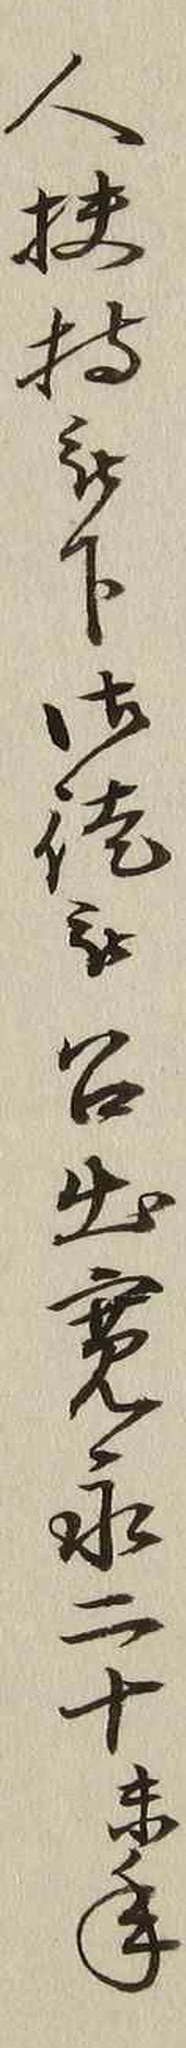人扶持被下御徒被召出寛永二十未年
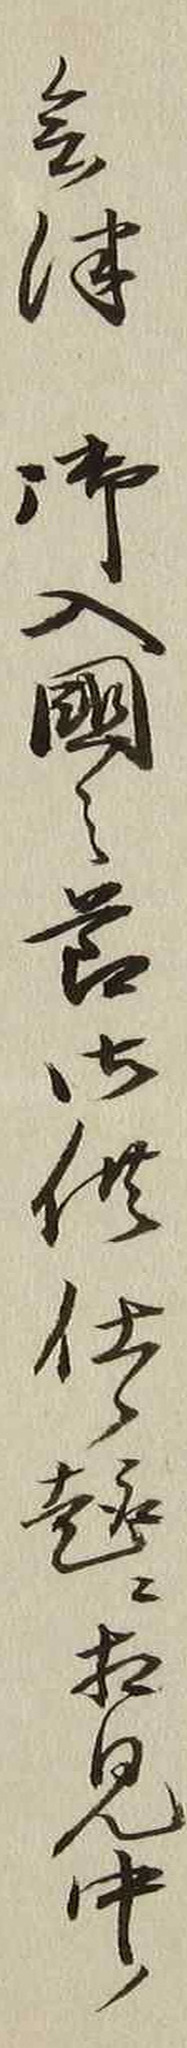会津御入国之節御供仕候趣ニ相見中ノ
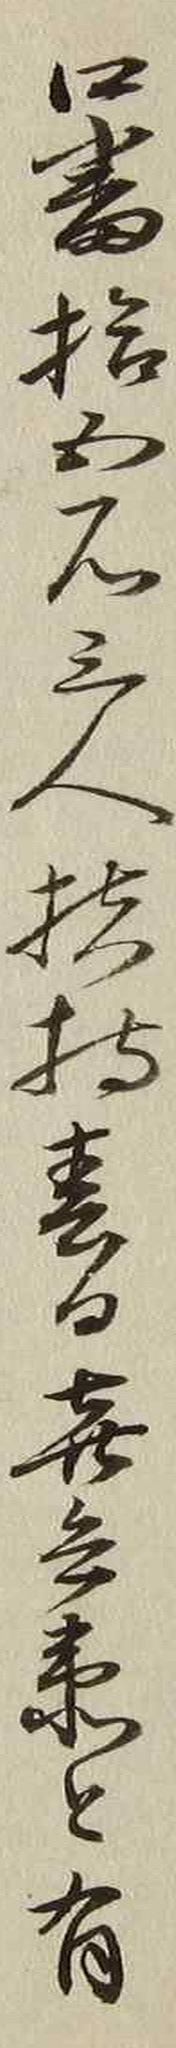口番拾五石三人扶持春日喜兵衛と有
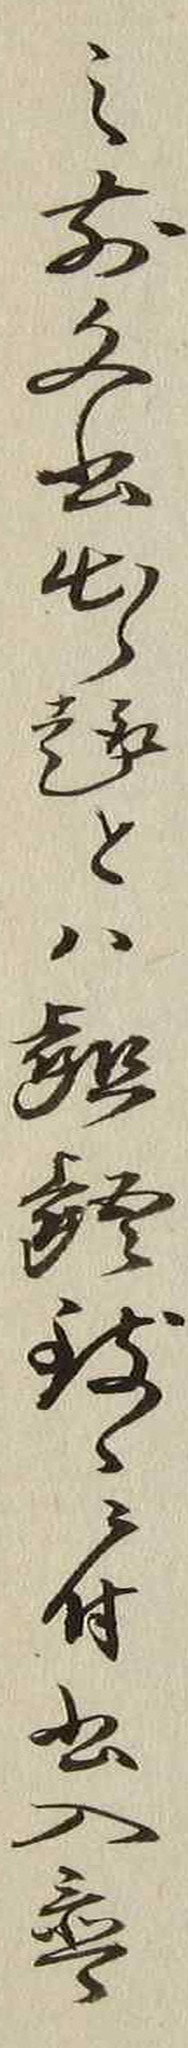之前文書出候趣とは齟齬致候ニ付書入置候
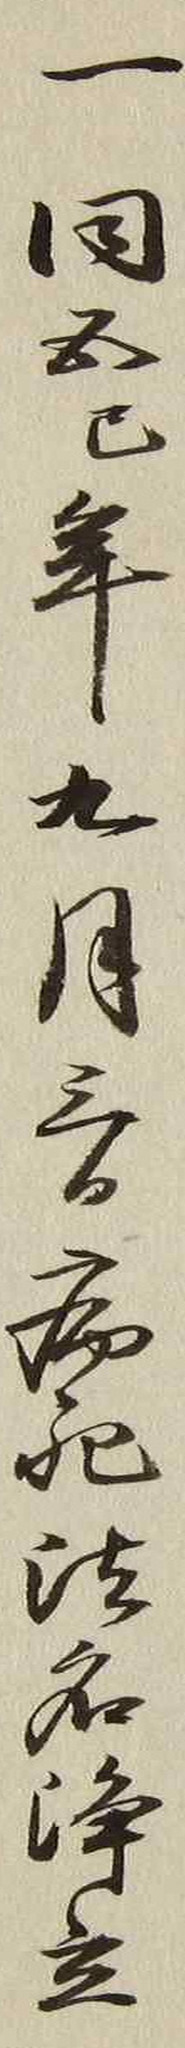一同五巳年九月三日病死法名浄立
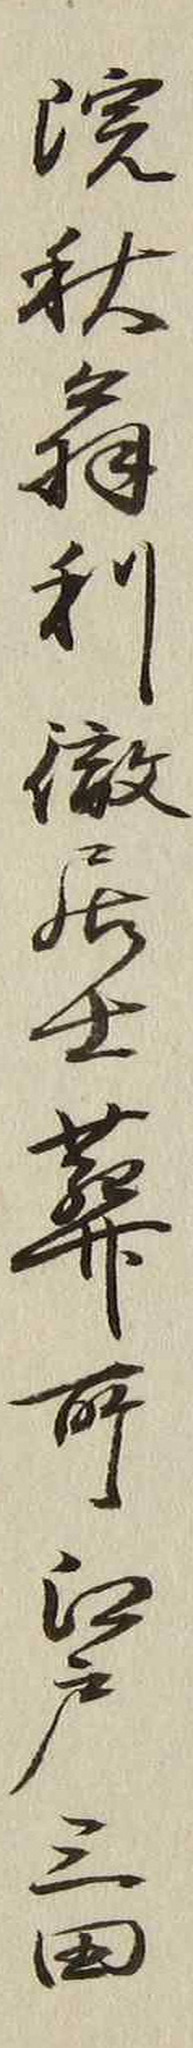院秋翁利徹居士葬所江戸三田
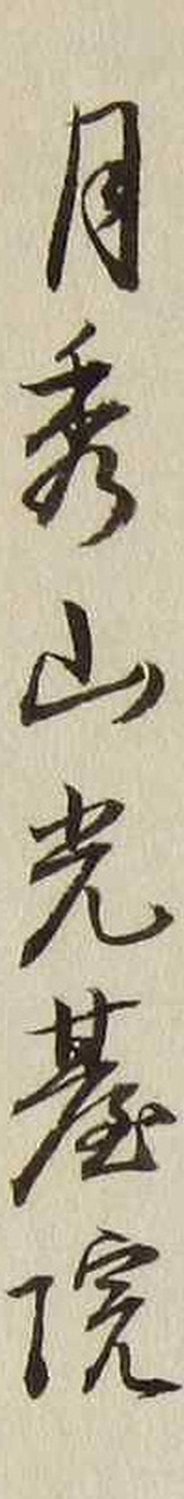月秀山光台院
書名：諸士系譜　巻之102　か之部10
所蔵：会津若松市立会津図書館
